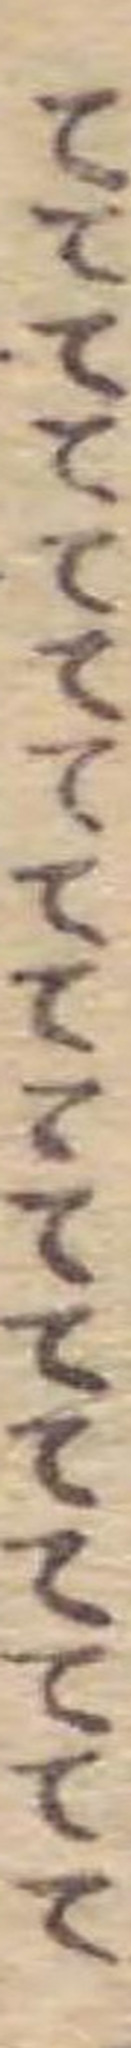ててててててててててててててててて
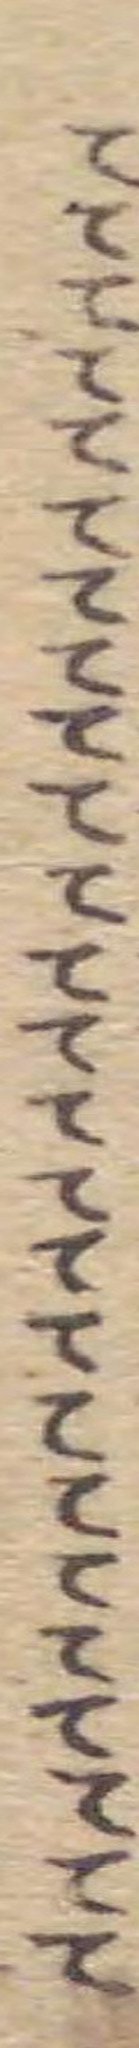ててててててててててててててててててててててててて
